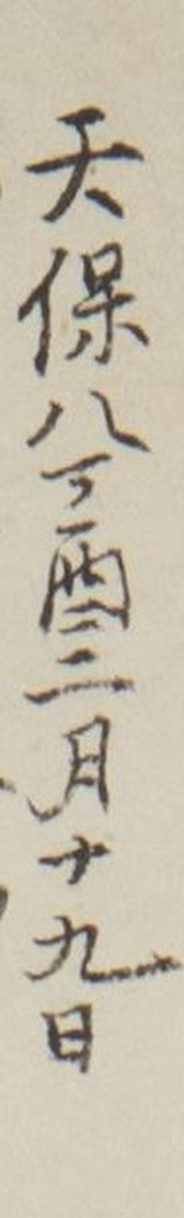天保八丁酉二月十九日
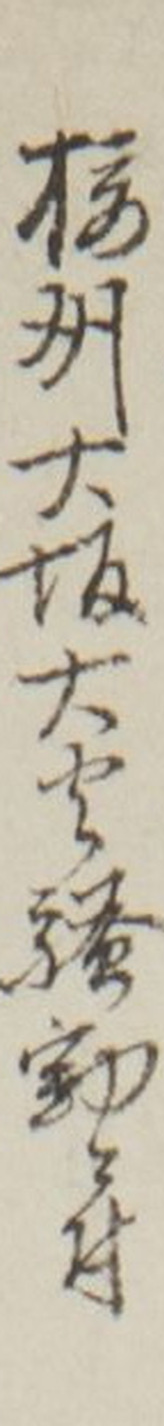摂州大坂大火騒動に付
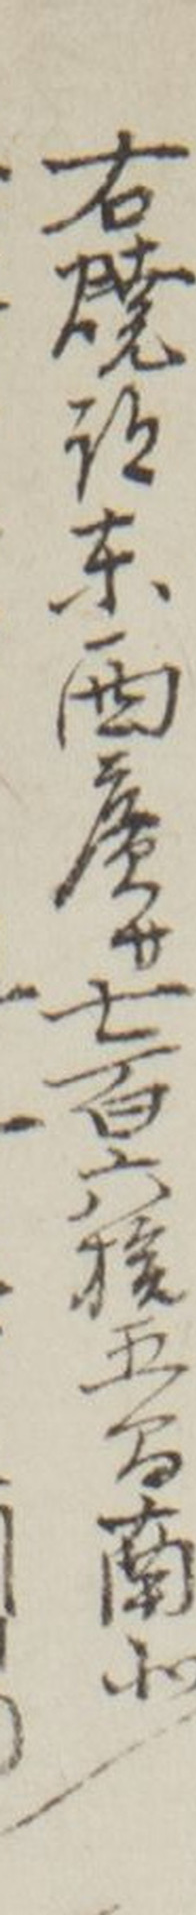右焼跡東西広サ七百六拾五間南北
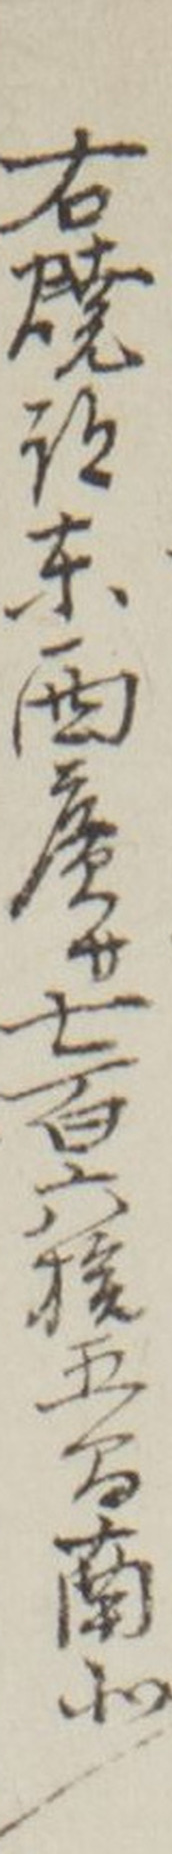右焼跡東西広サ七百六拾五間南北
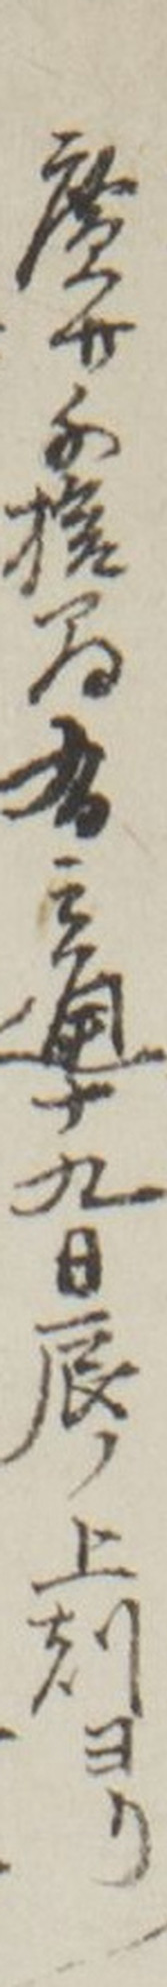広サ千拾間右之通十九日辰ノ上刻より
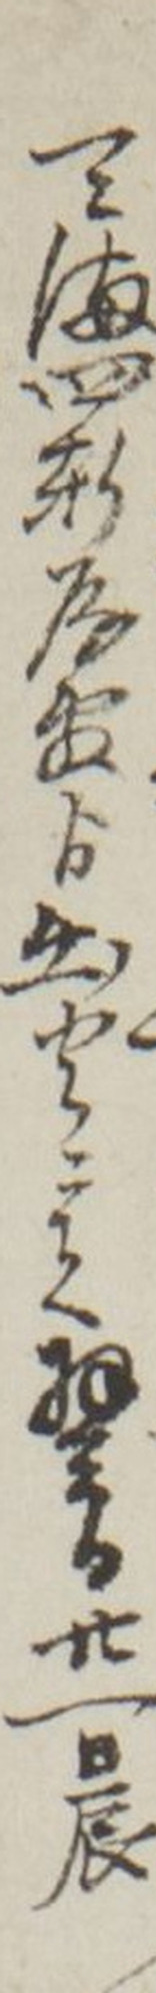天満四軒屋敷ゟ出火にて翌日廿一日辰
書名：大坂大火騒動絵図
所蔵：あいおいニッセイ同和損保株式会社
